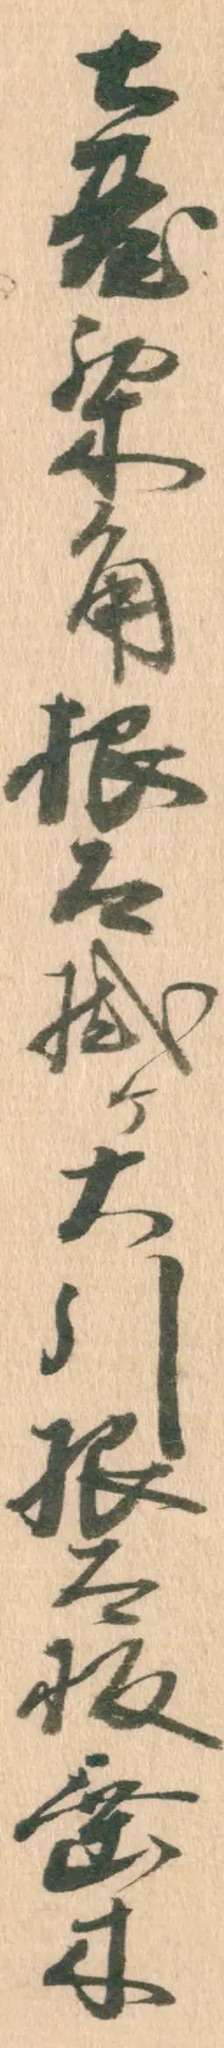土台栗角根太掛ケ大引根太板垂木
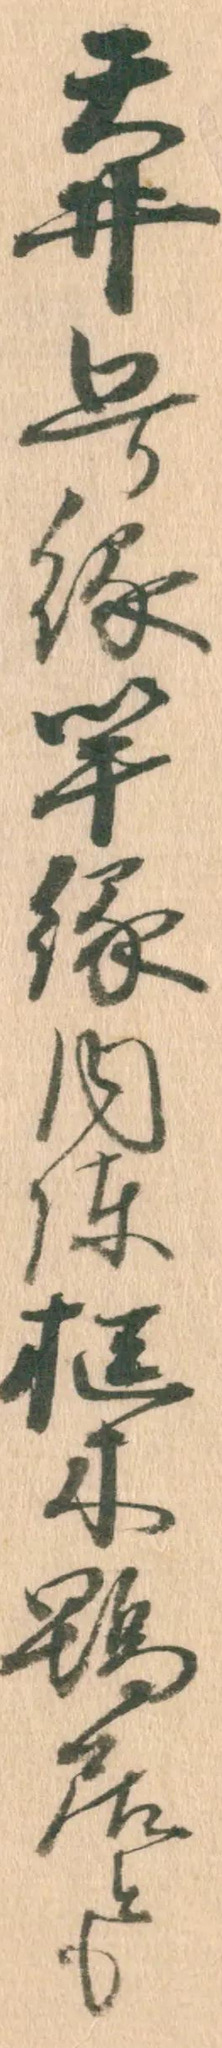天井廻り縁竿縁内陣框木鴨居とも
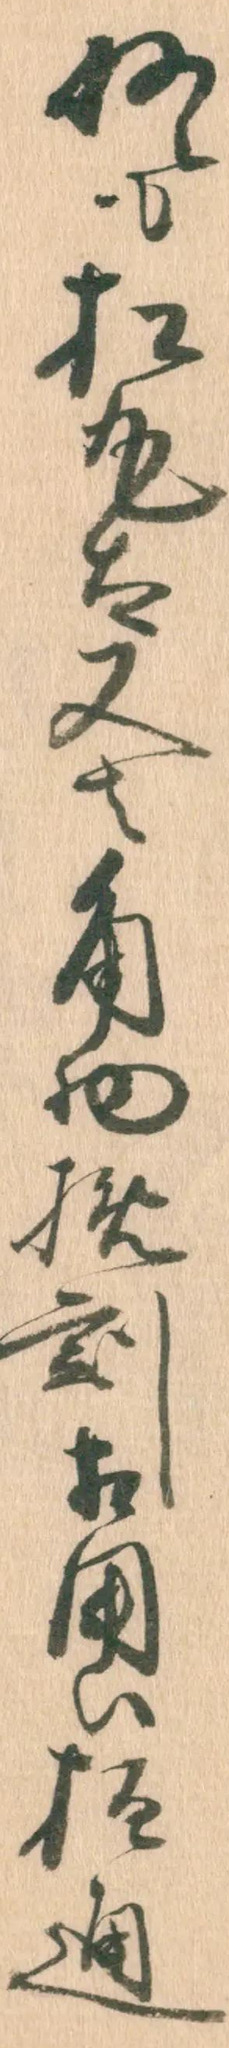何レも松丸太又は角物挽割相用い柱通
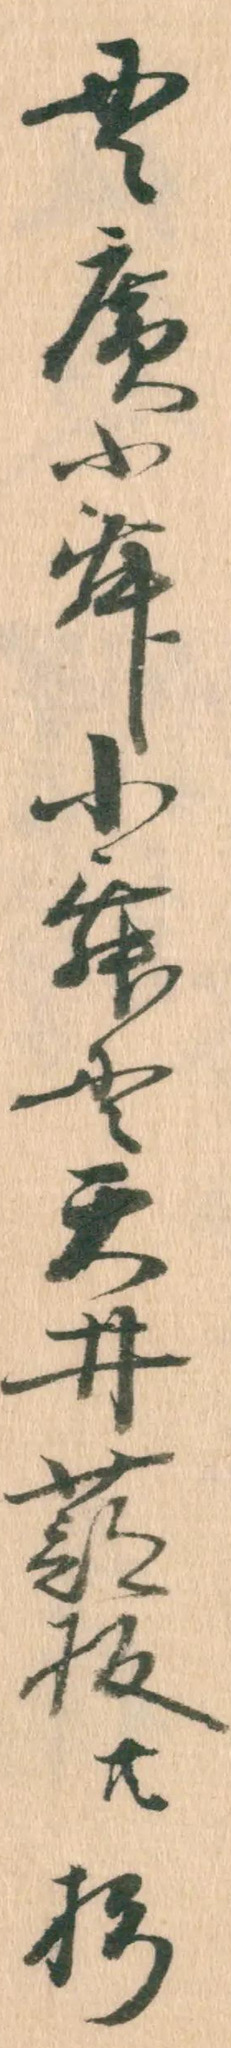貫広小舞小舞貫天井蔀板共杉
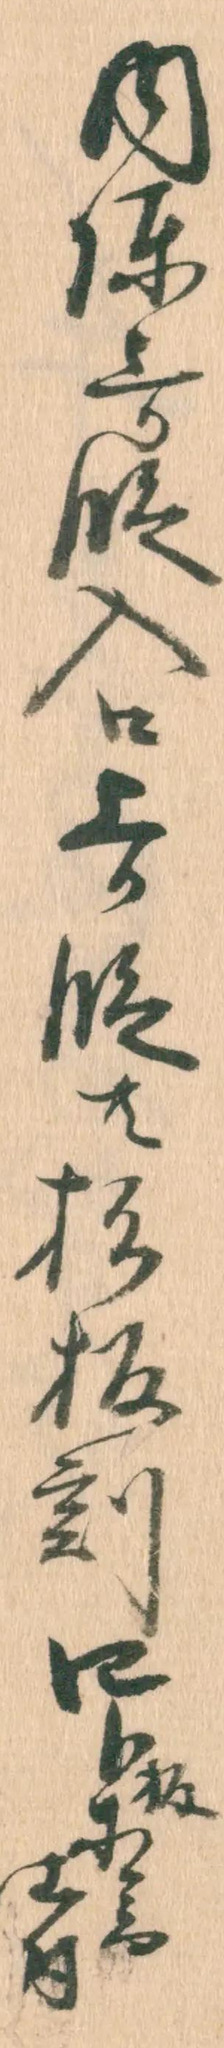内陣上り段入口上り段とも杉板割四分板等ニて仕付
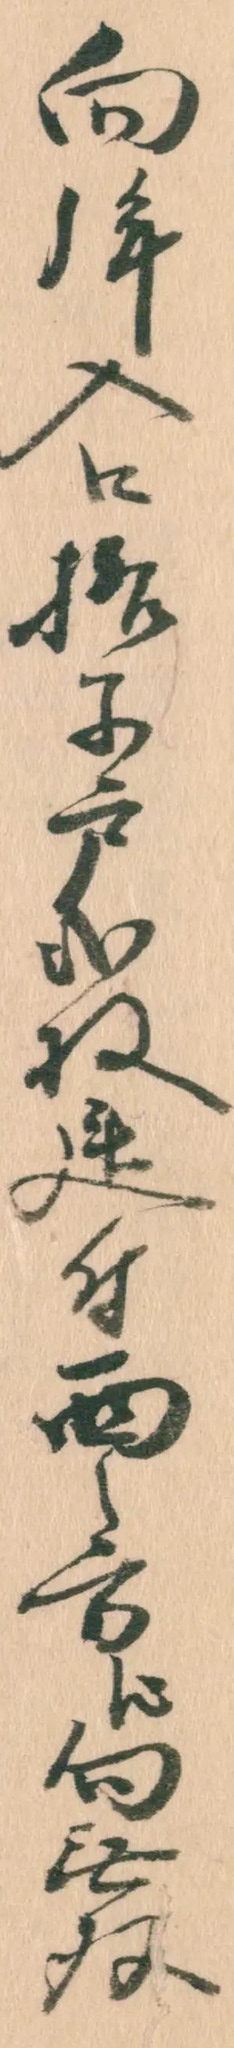向拝入口格子戸弐枚建付西之方え向無双
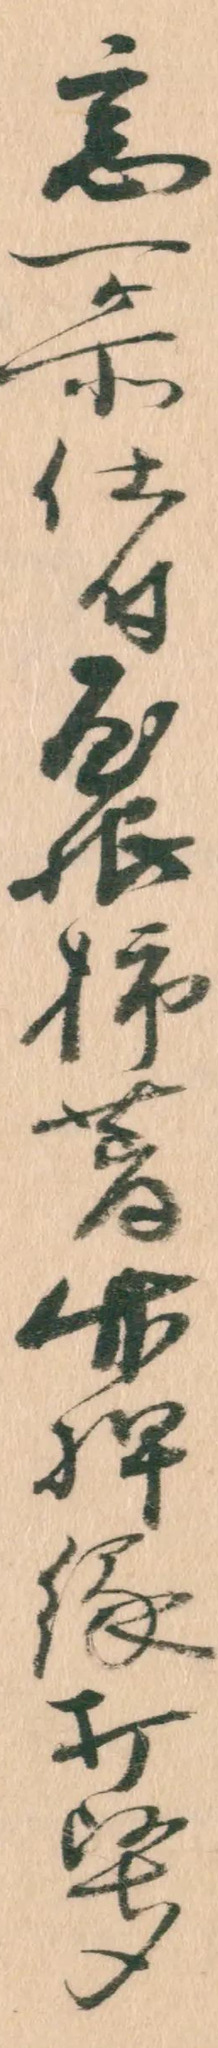窓一ケ所仕付屋根杮葺竹押縁打堅メ
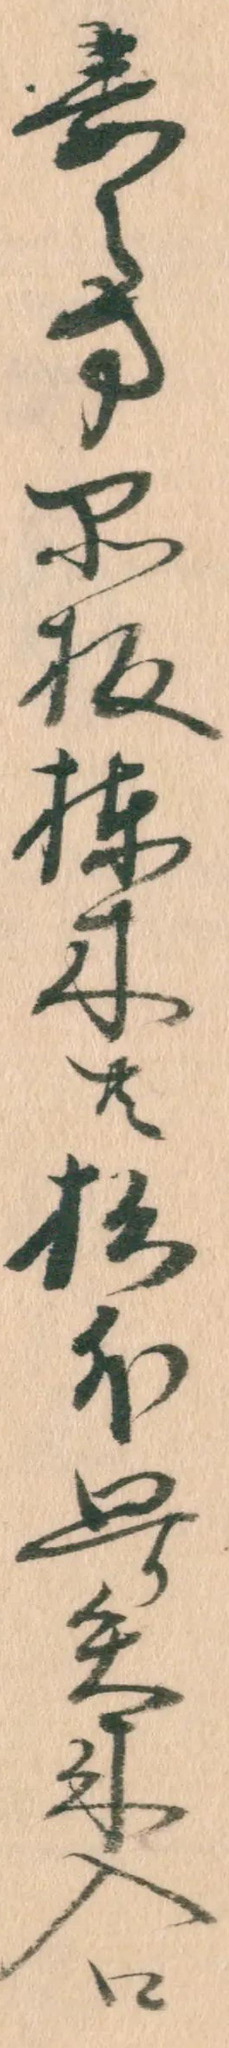妻之方品板棟木共杉外廻り矢来入口
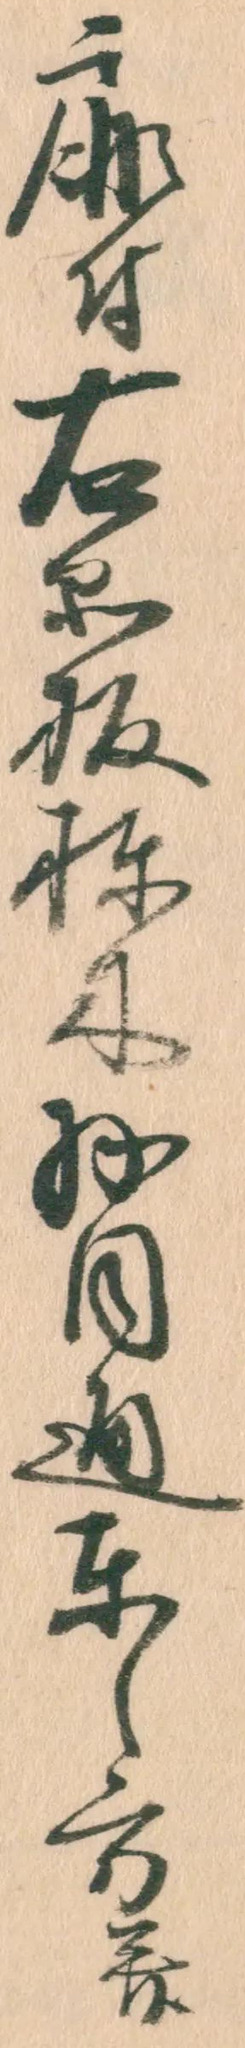扉付右品板棟木羽目通東之方幷
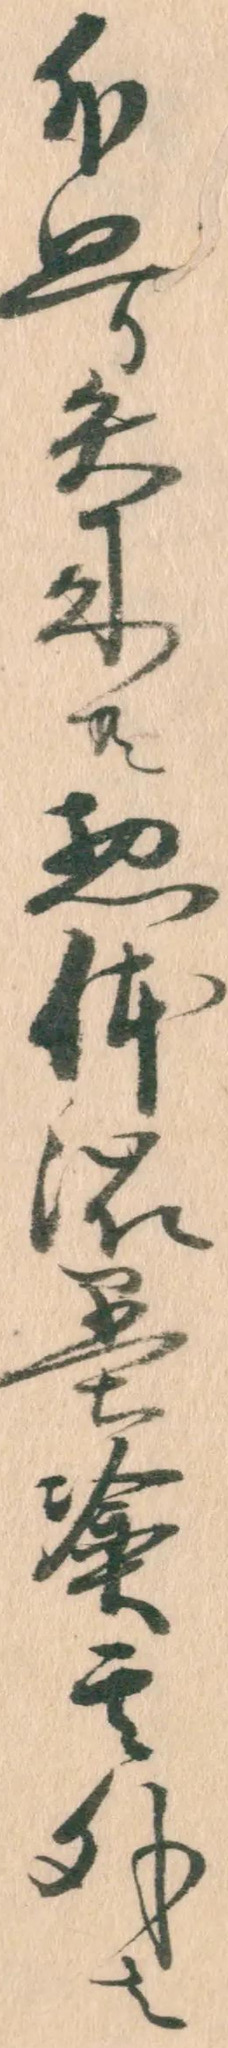外廻り矢来共惣体渋墨塗其外は
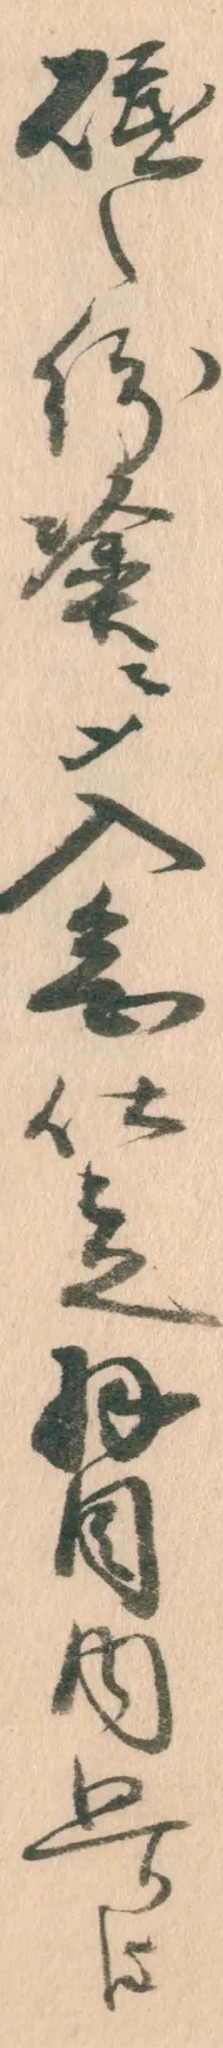砥之粉塗ニ〆入念仕立羽目内廻りえ

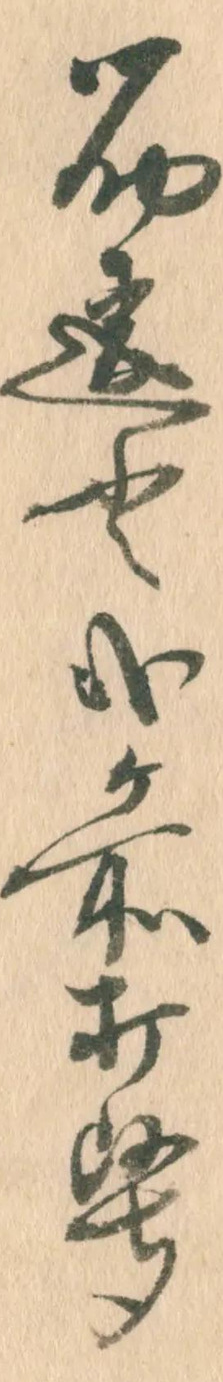筋違貫弐ケ所打堅メ
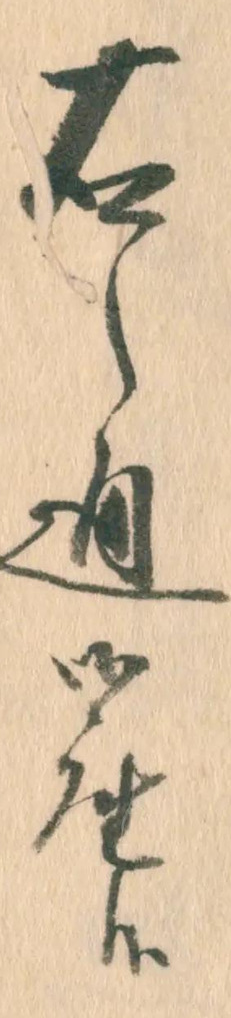右之通御座候

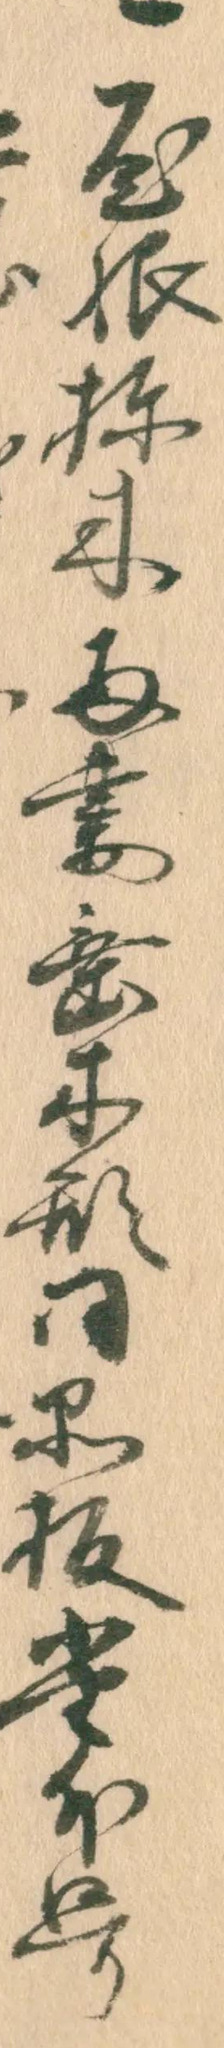一屋根棟木両業垂木形同品板堂外廻り
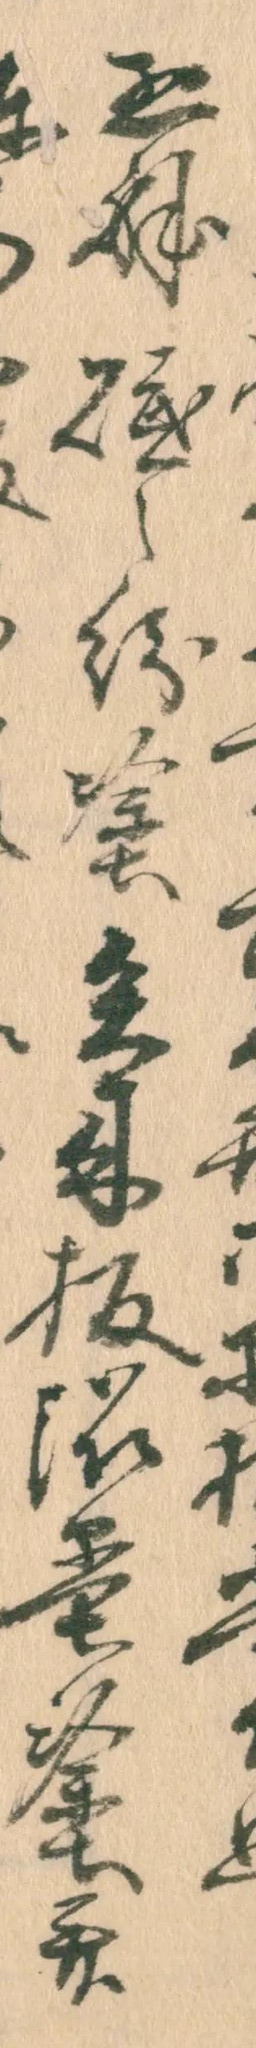惣体砥之粉塗矢来板渋墨塗幷
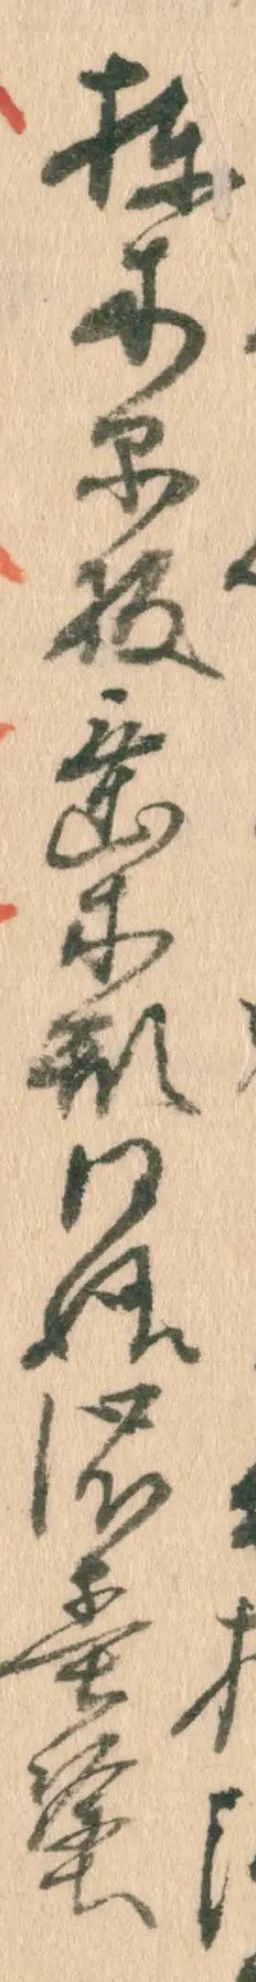棟木品板垂木形同様渋墨塗
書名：三十三間堂. [2]
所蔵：国立国会図書館 National Diet Library, JAPAN
